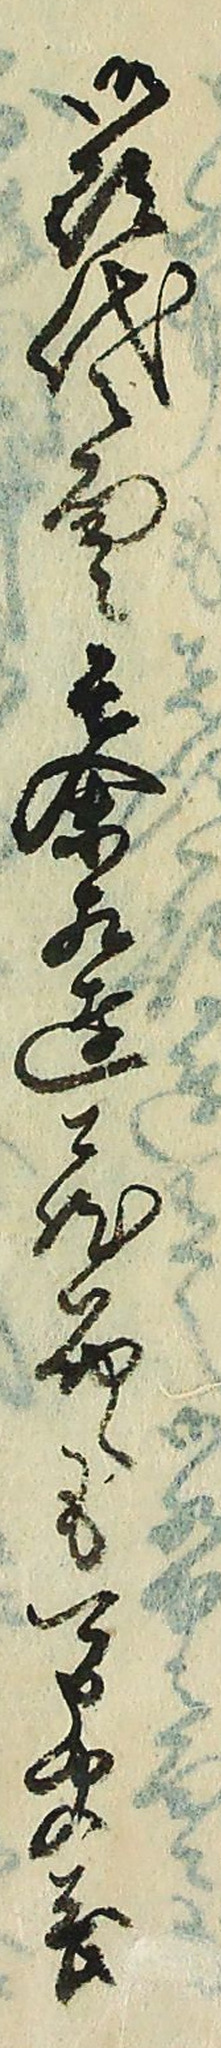御郡代之面々其余相達可然筋へも可申聞義
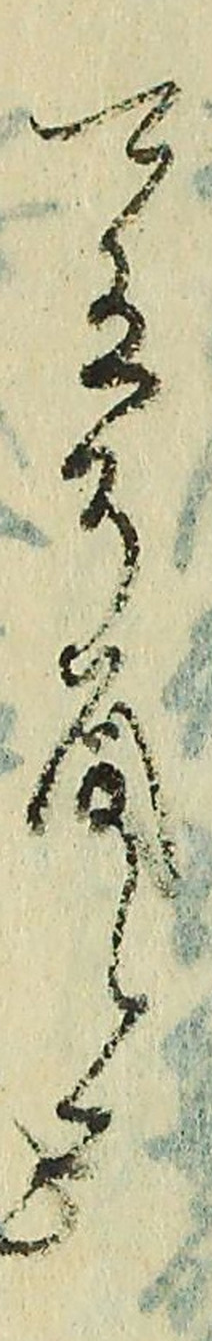可有了簡候以上
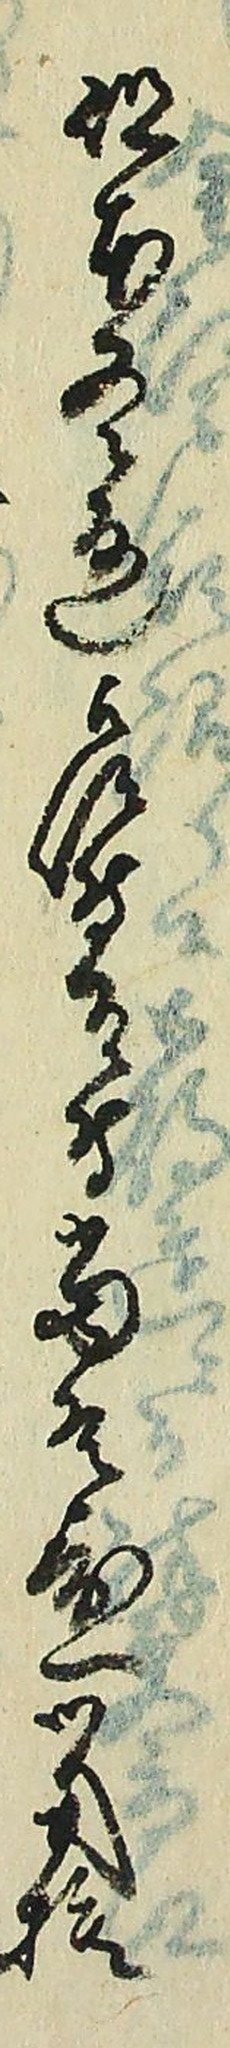但本文之通被仰付候ニ付當冬歩一御用捨
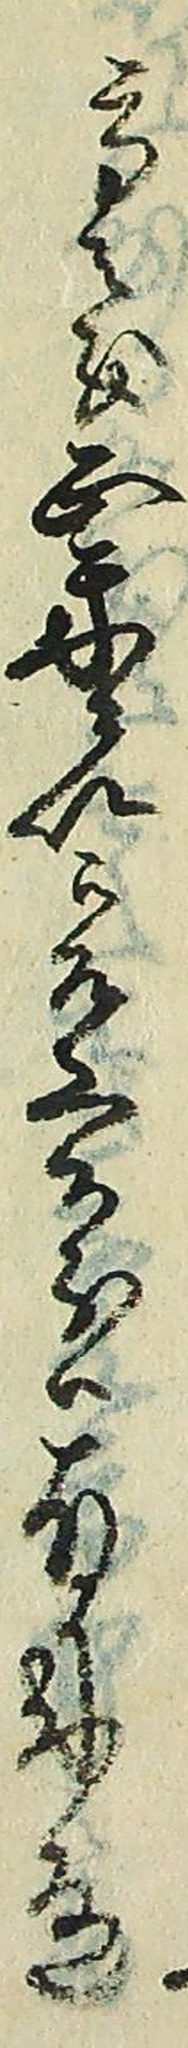高之義正米ヲ以被召上候分ハ有来通
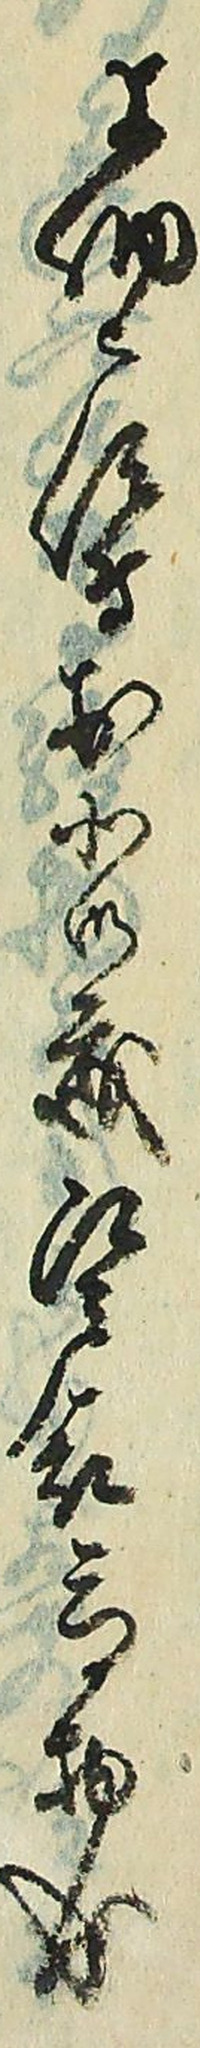上納被仰付於北御蔵江戸表高物成
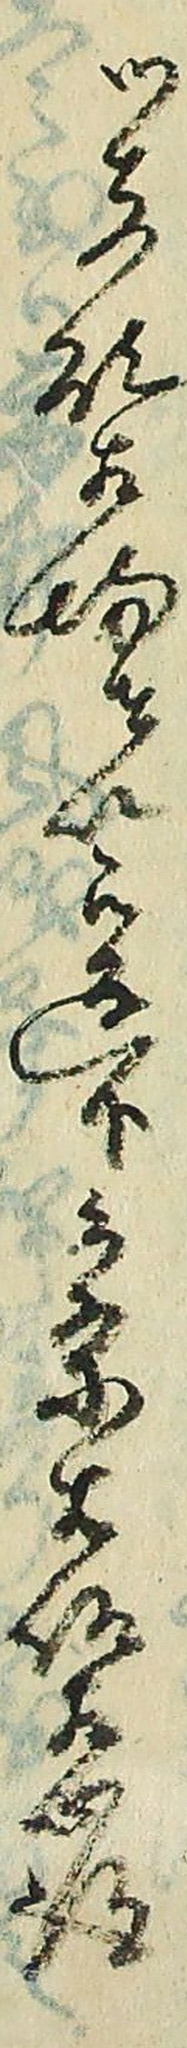御支配相場を以被通下候条右様相心得
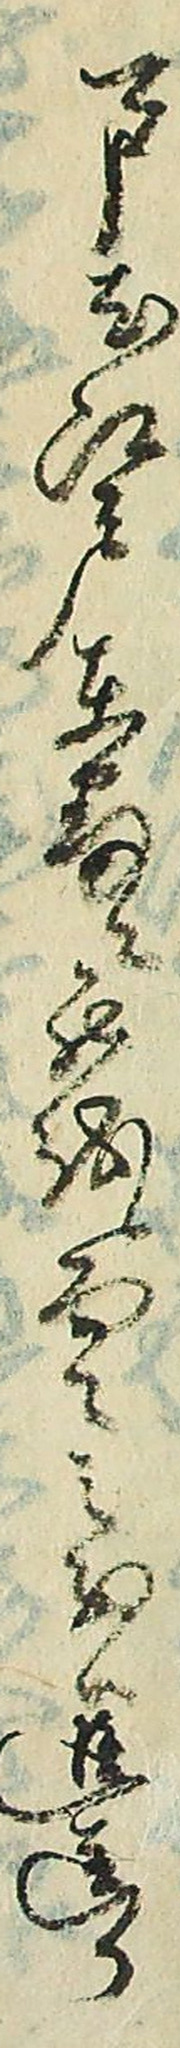可申尤江戸在番ニ罷越候面々之義ハ追送り

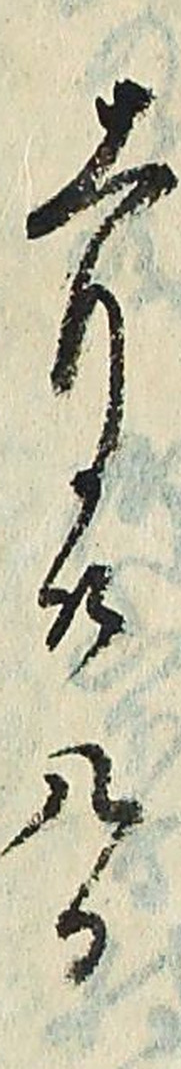十一月廿八日
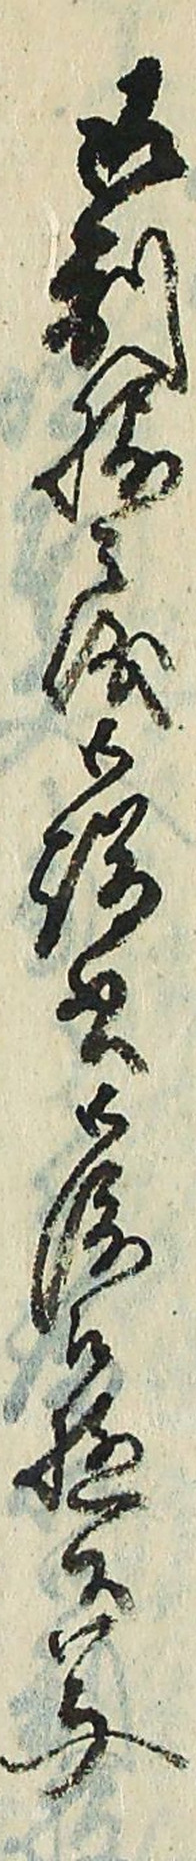御制服之儀御端書御渡被遊候写
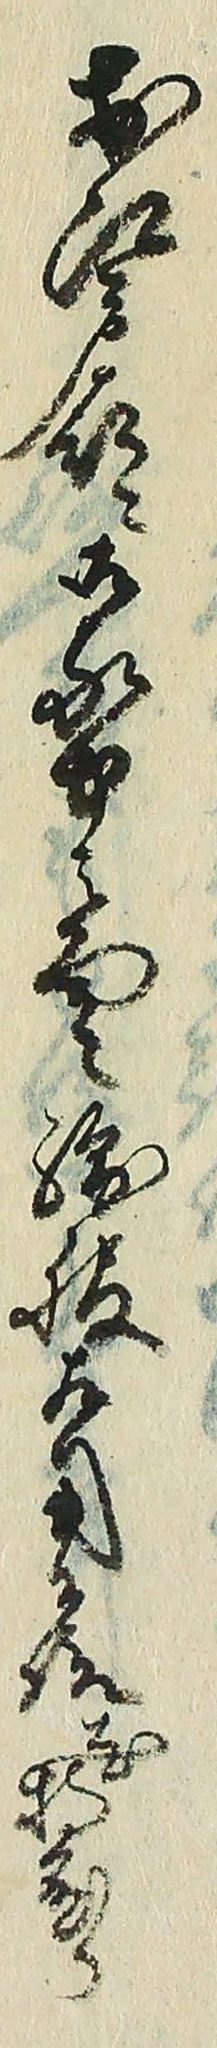於江戸表ニ御家中之面々綿服相用候様尤持懸り
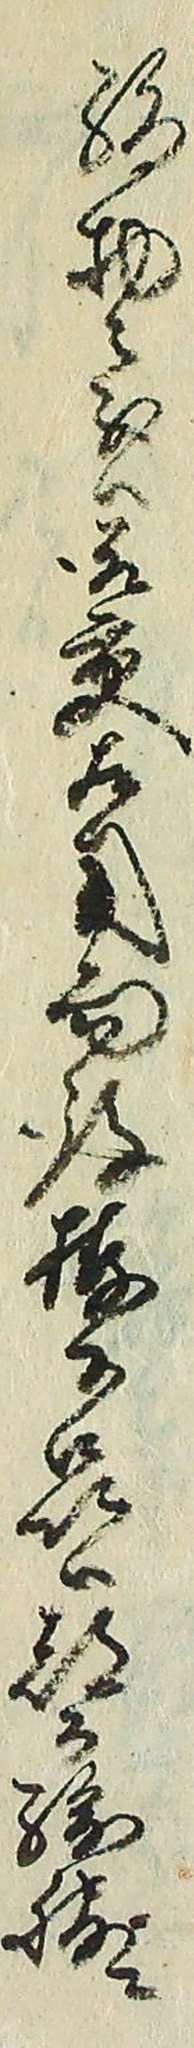絹物之義ハ取交相用向後拵候品ハ都而綿服ニ
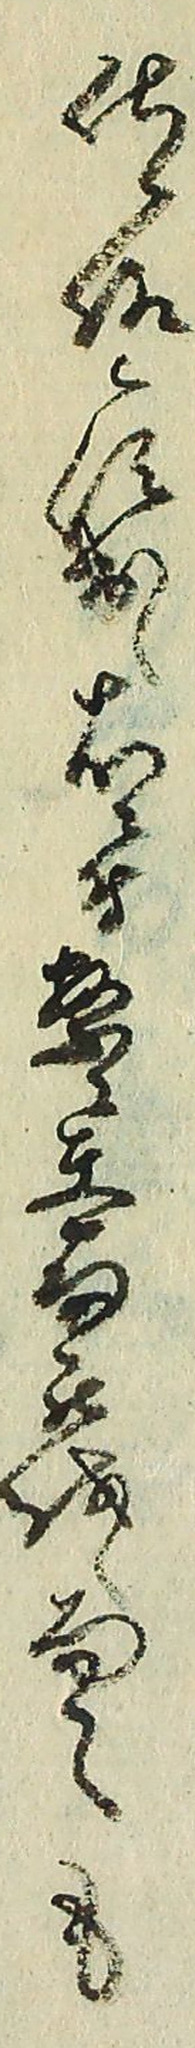仕候様被仰出候右ニ付繁ニ在番罷越候面々も
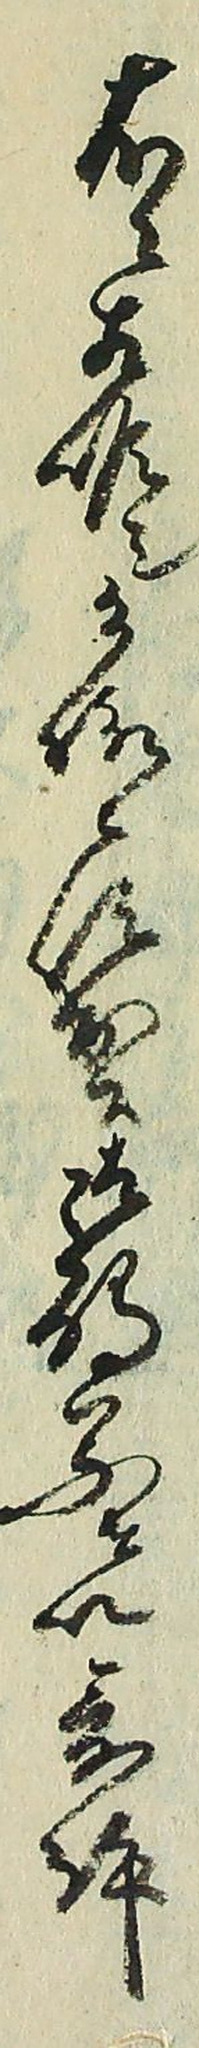右ニ相順シ候様被仰出候御觸写を以爰許
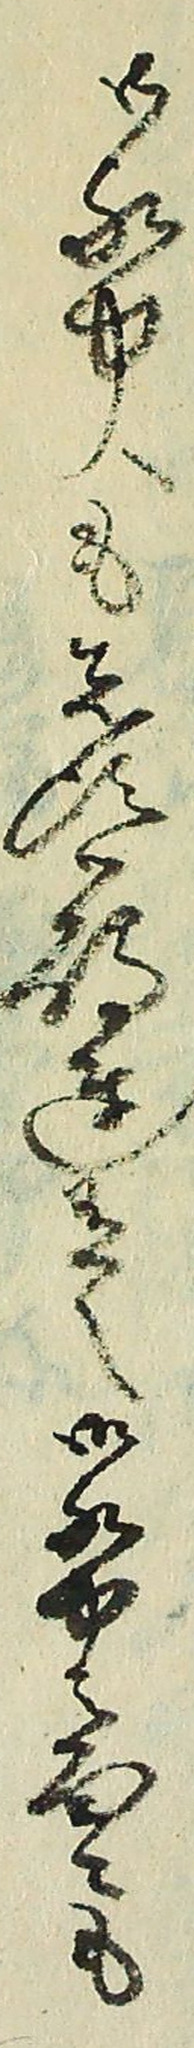御家中へも先頃御觸達有之御家中之面々も
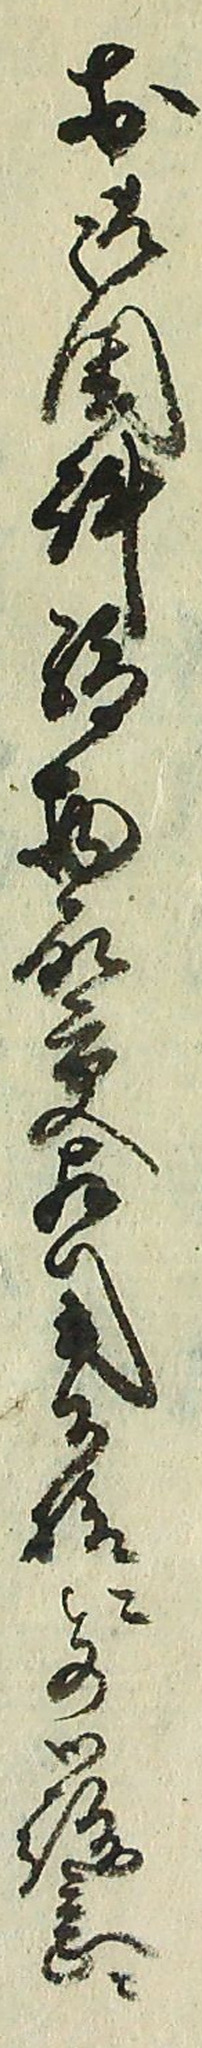於御国許絹物取交相用候様ニとの御趣意ニ
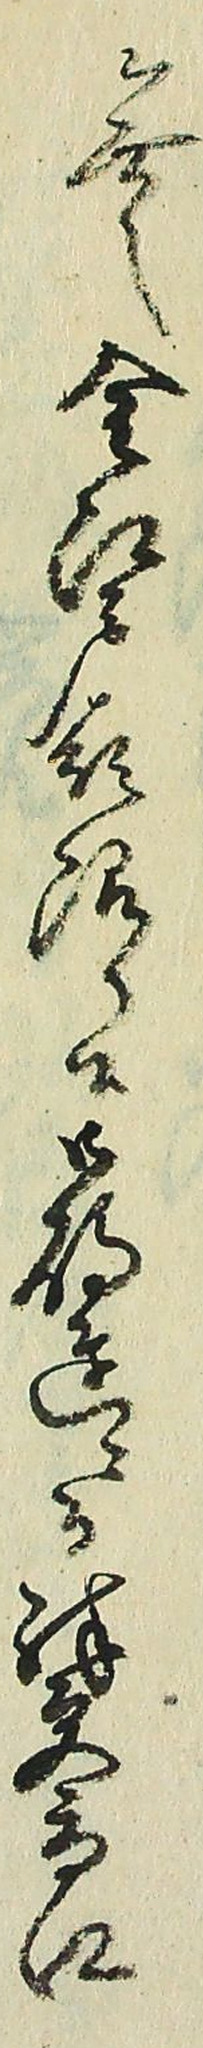無之全江戸表限り候御觸達ニ而殊更市郷
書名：諸御趣意書并御下知向之写
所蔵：鳴門教育大学 Naruto University of Education
